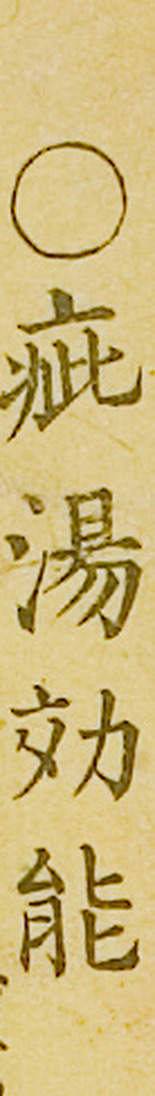○疵湯効能
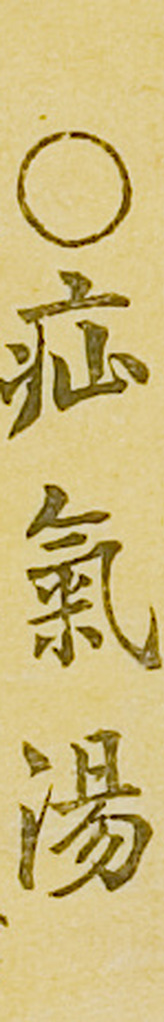○疝気湯
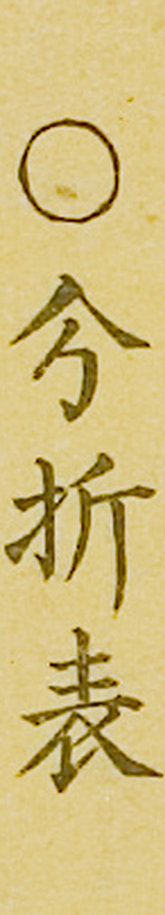○分析表
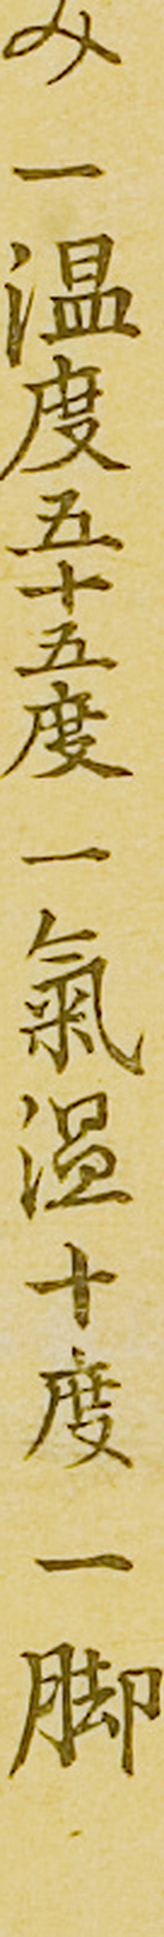一温度五十五度一気温十度
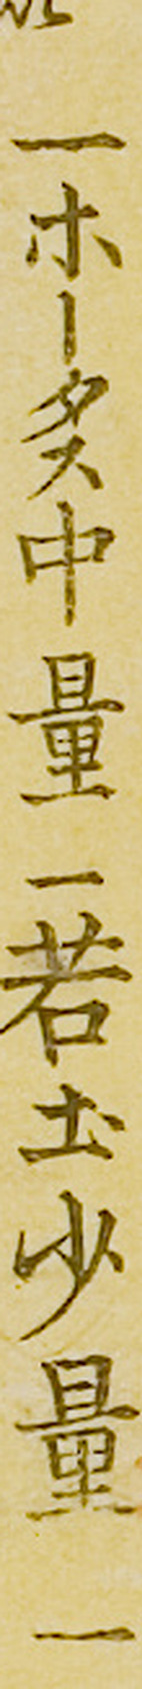一ホータス中量一若土少量
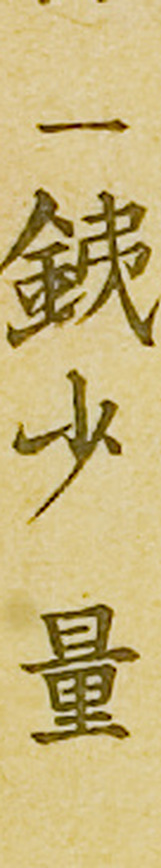一鉄少量
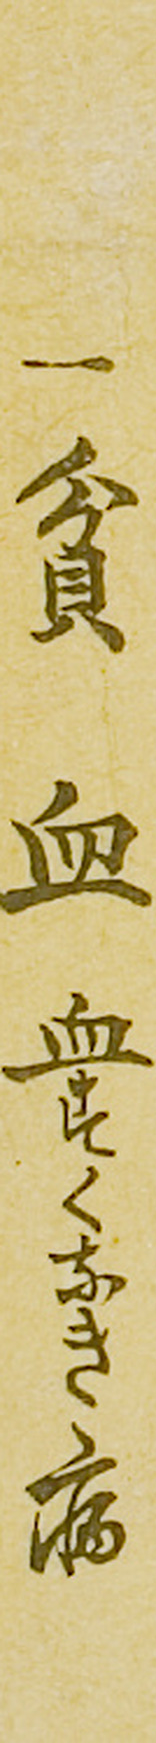一貧血血のすくなき病
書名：最上郡肘折温泉図
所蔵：東京大学総合図書館 General Library in the University of Tokyo, JAPAN
